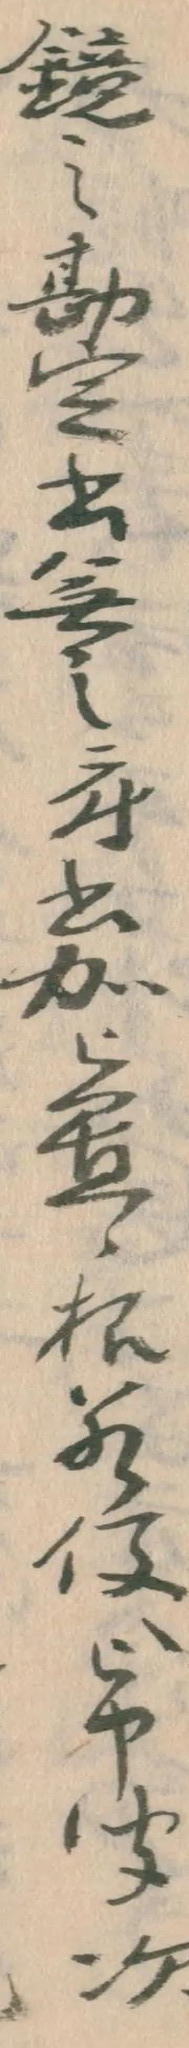鏡之勘定書無之ニ付書加被置候様若役へ被申聞次
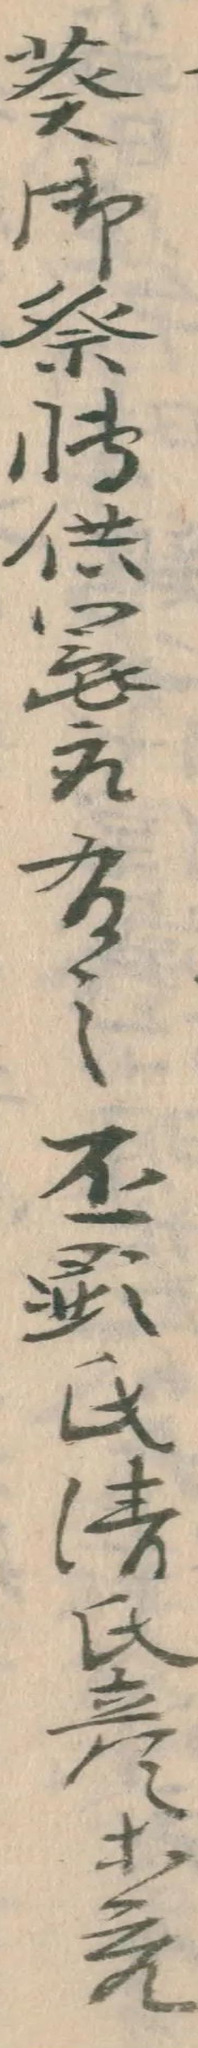葵御祭轉供鬮取有之丕顕氏清氏彦等充
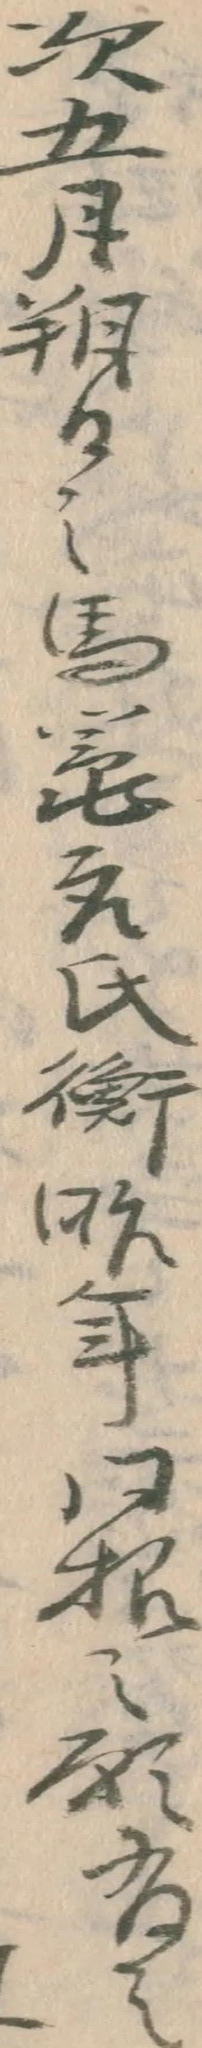次五月朔日之馬鬮取氏衡昨年同様之願有之
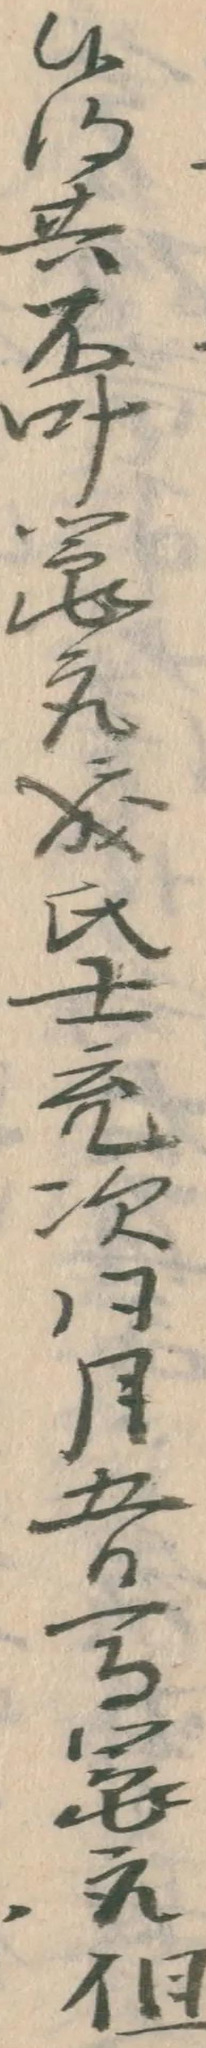候得共不叶鬮取成民士充次同月五日馬鬮取但
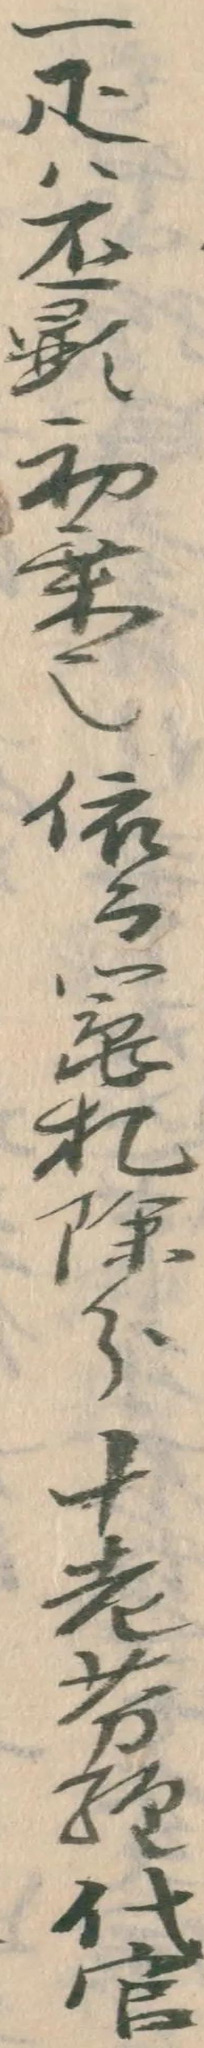一疋ハ丕顕初乗也依而鬮札除分十老芬経代官
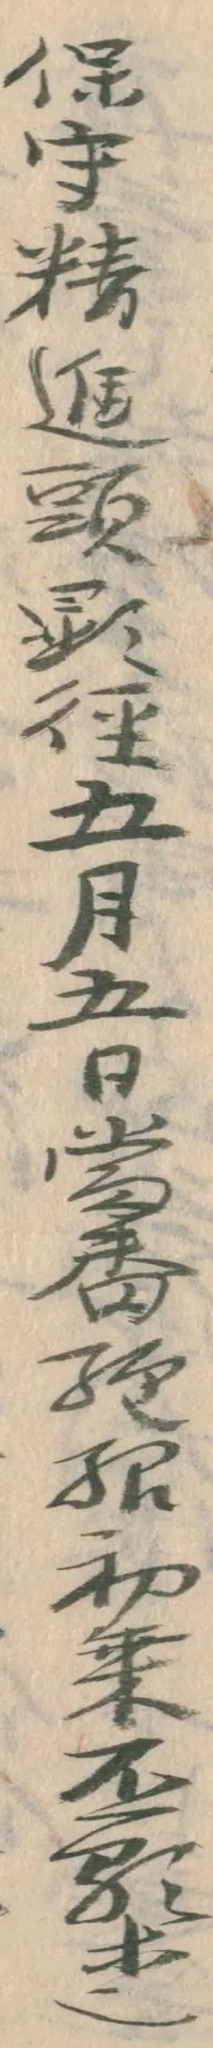保守精進頭顕径五月五日當番経招初乗来丕顕等也
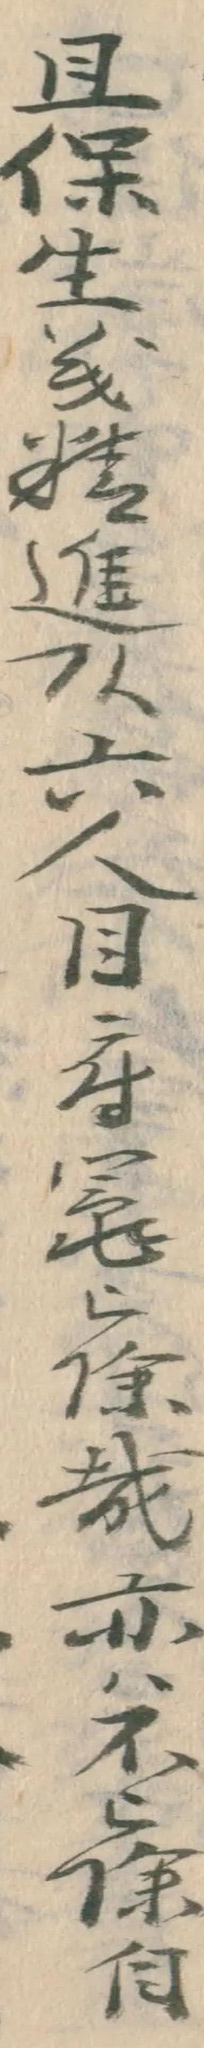且保生義精進頭六人目ニ付鬮被除哉亦ハ不被除自
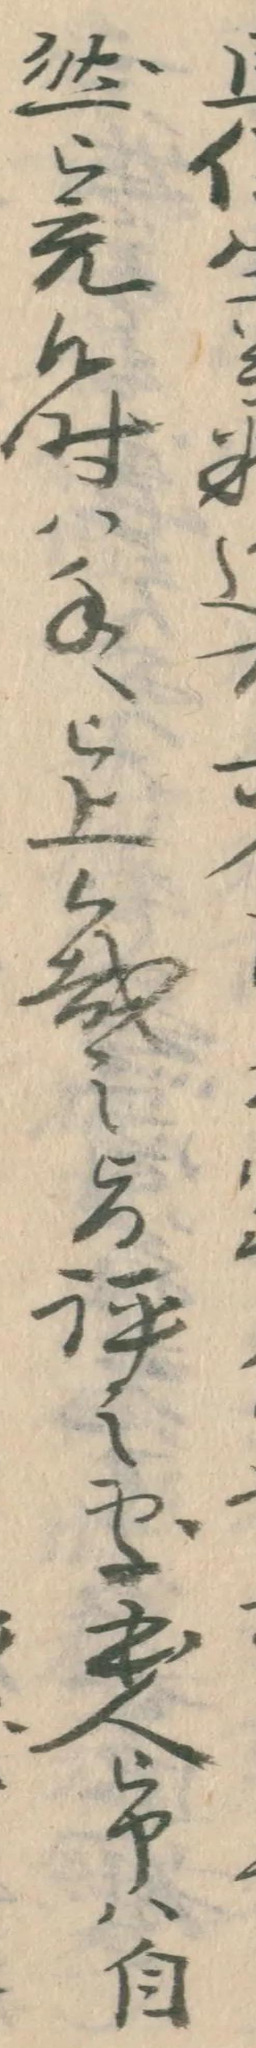然被充候時ハ手へ被上候哉之旨評之處本人被申ハ自
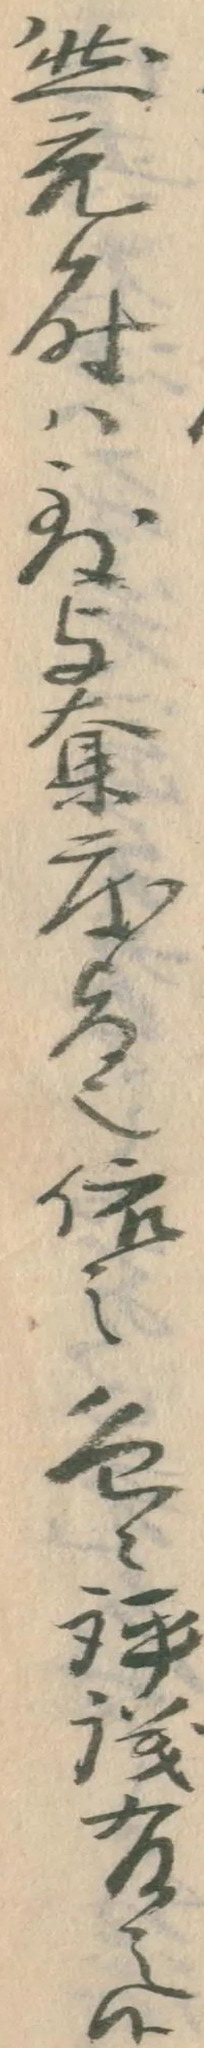然充候時ハ不及与奪度旨也依之色〻評議有之候

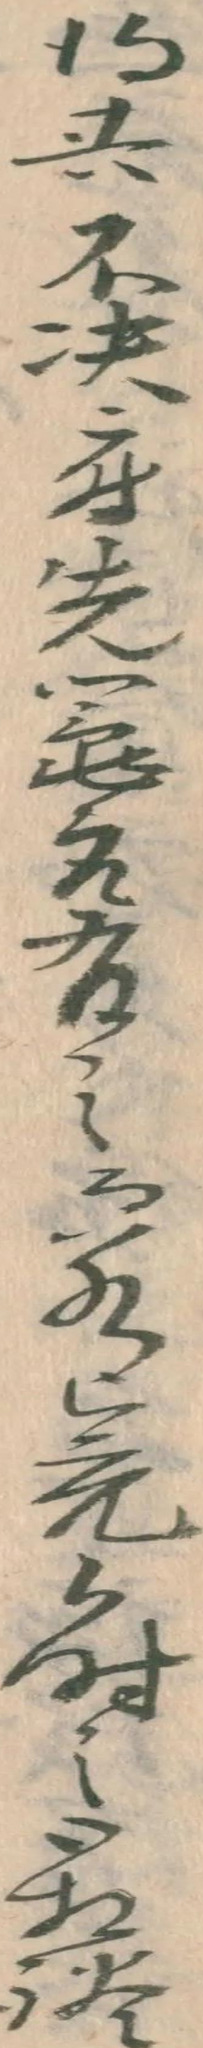得共不決ニ付先鬮取有之而若被充候時之御相談
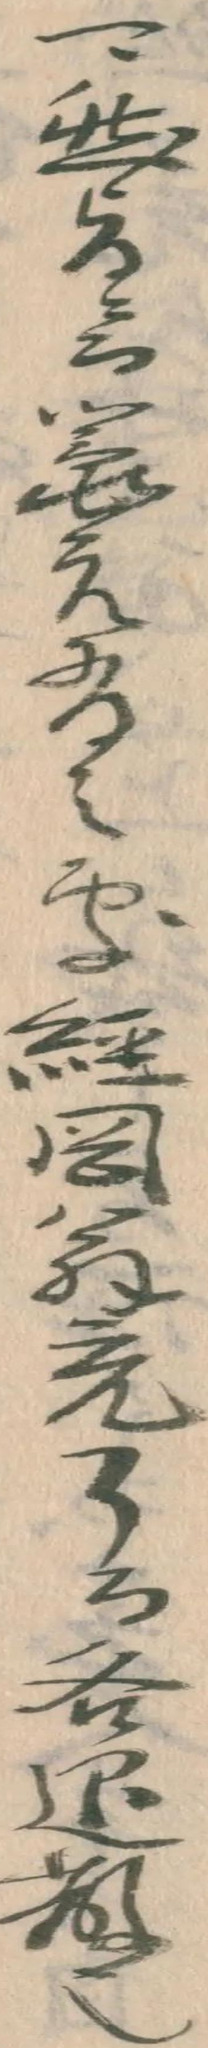可然旨ニ而鬮取有之處経岡翁充了而各退散也
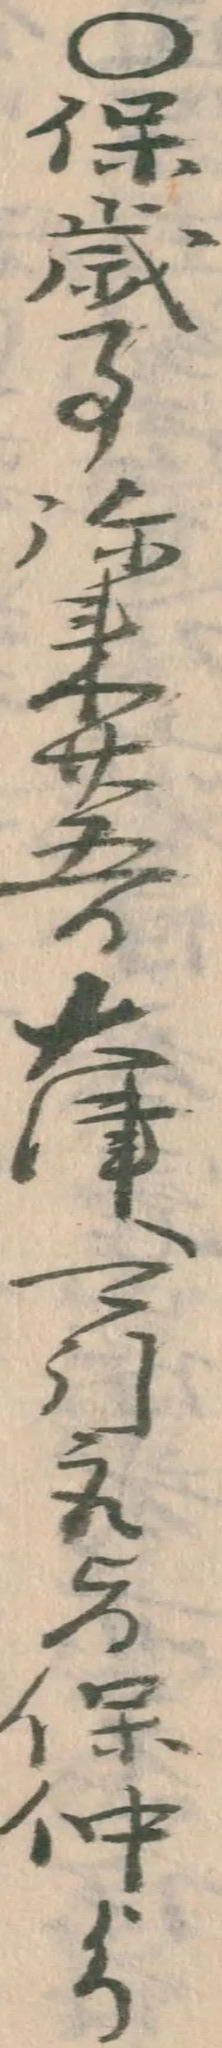○保歳事弥来廿五日大津へ可引取旨保仲より
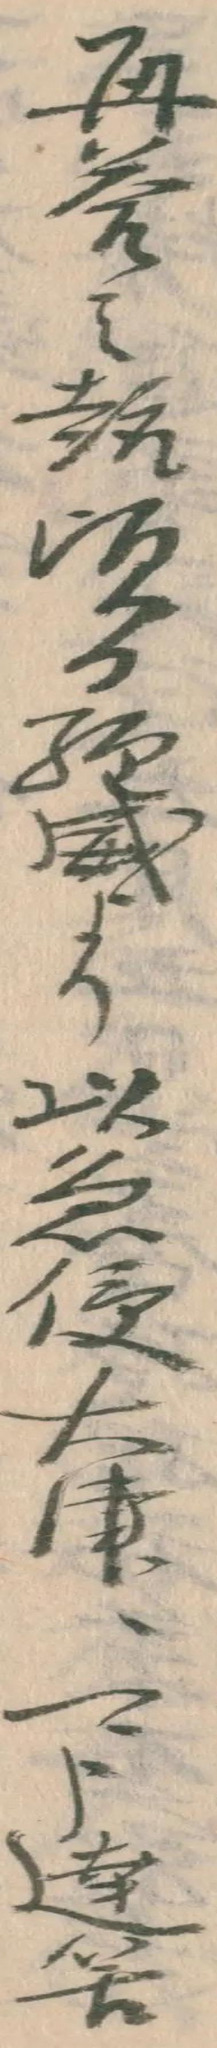再答之趣頃日経威より此急使大津へ可申達筈
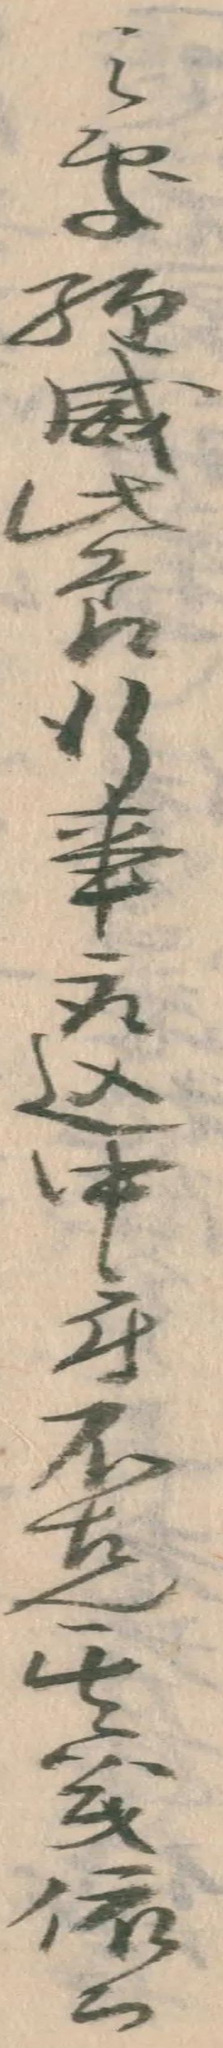之處経威此節行事取込中ニ付不意其義依而
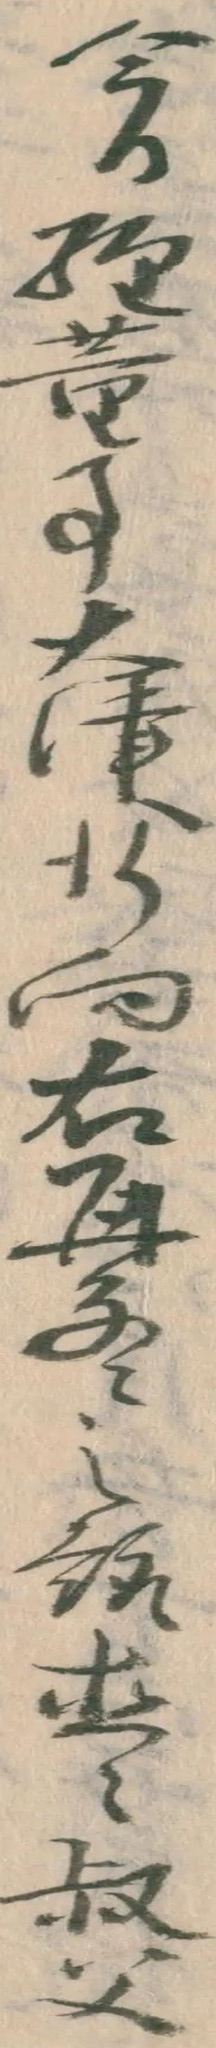今日経董事大津へ行向右再子ニ之趣直ニ叔父
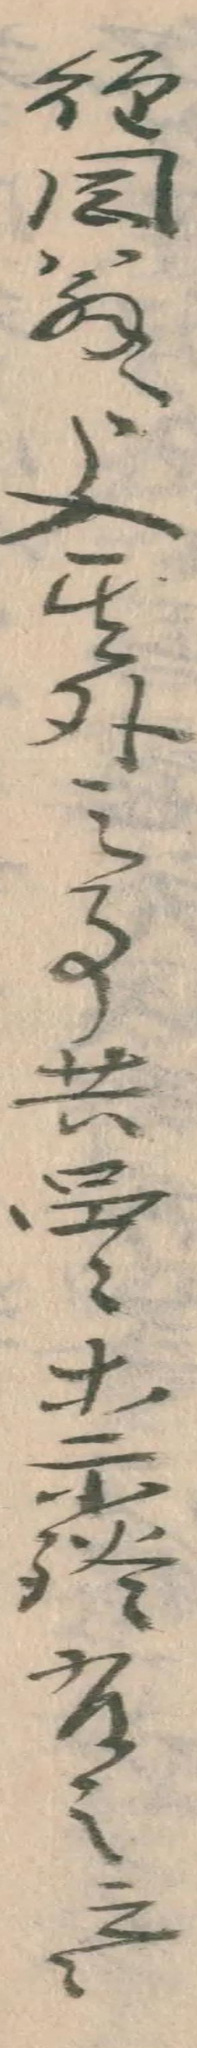経岡翁へ申入其外之事共品々等示談有之云々
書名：賀茂社記録. 第63冊
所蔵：国立国会図書館 National Diet Library, JAPAN
